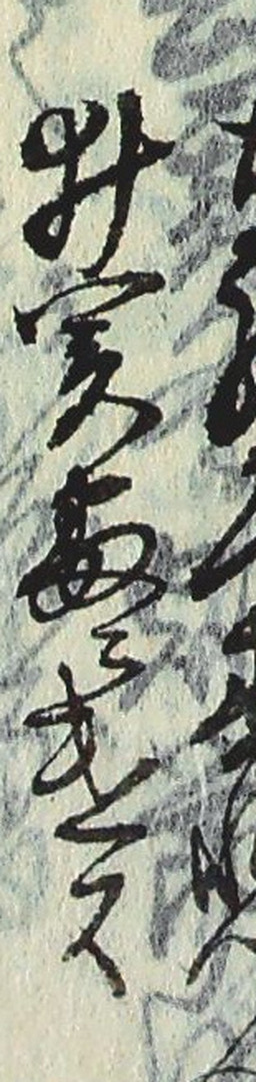井関番に遣す
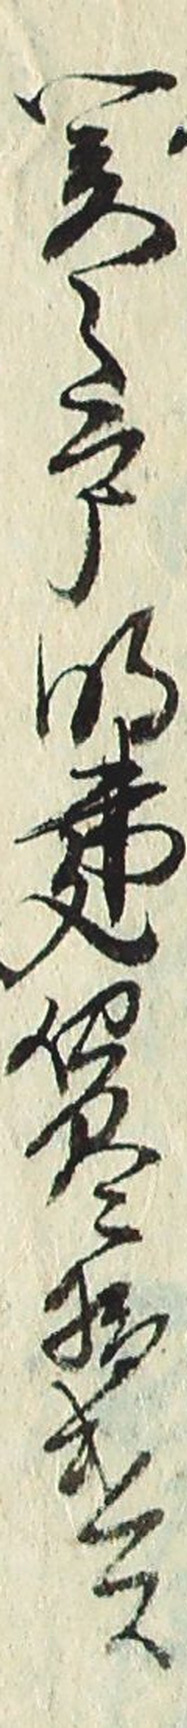関之戸明建賃に指遣す

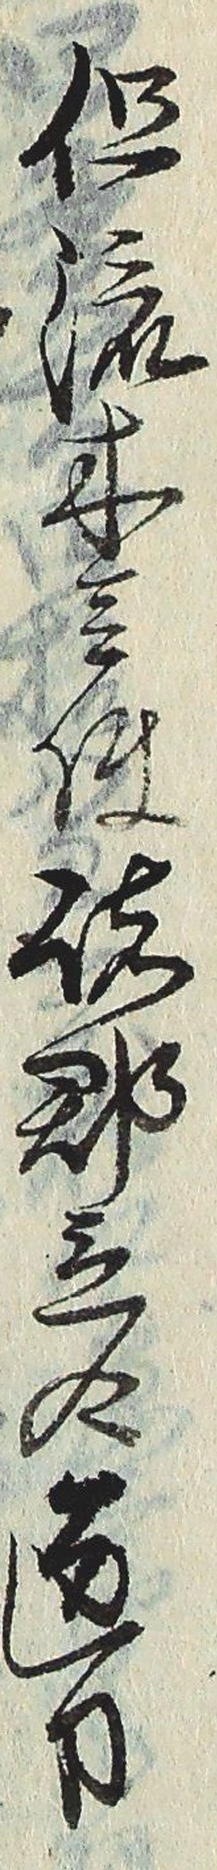但流木言使諸郡立合造用
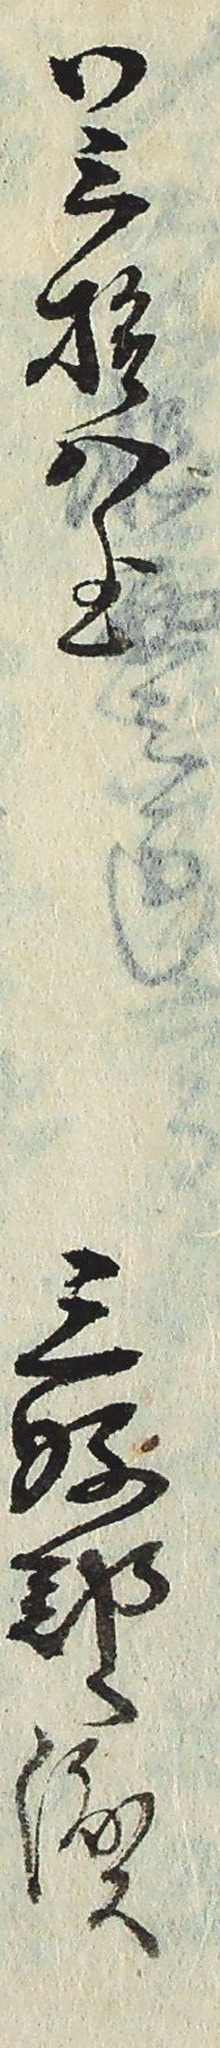同三拾八匁三好郡へ渡す
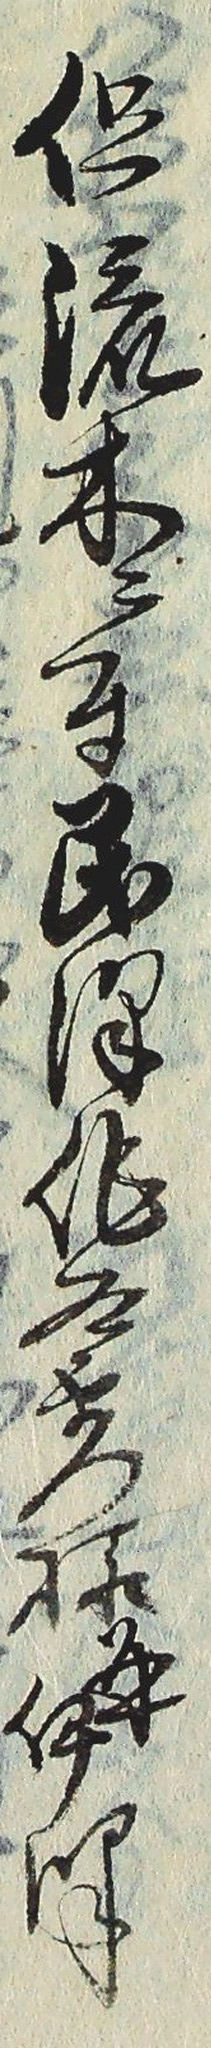但流木に付民沢作右衛門様并伊沢
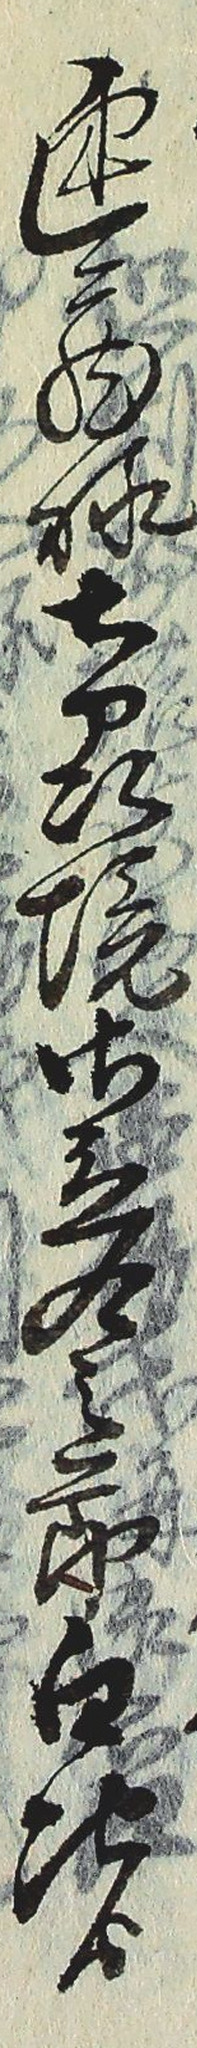速蔵様土州境御立合之節白池ゟ
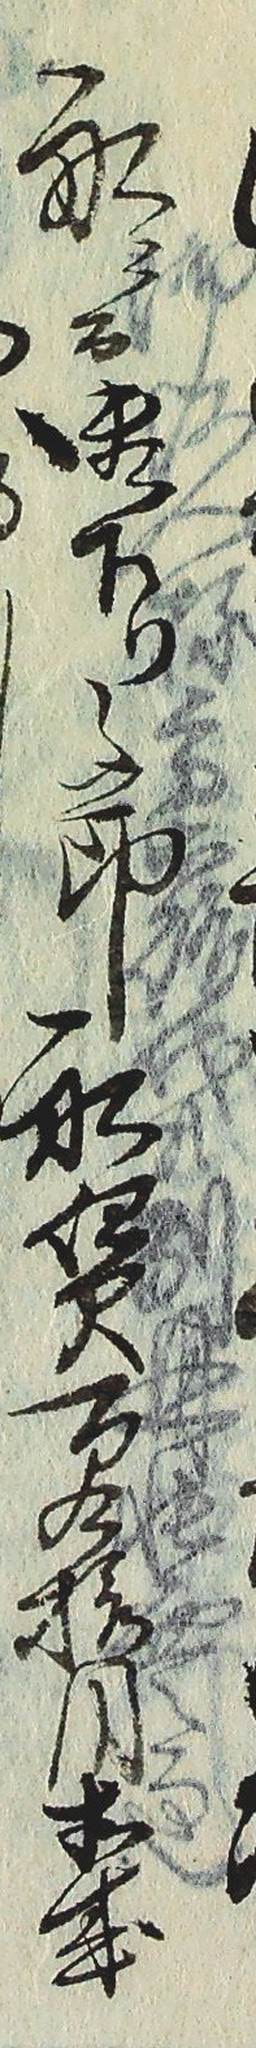船にて御下り之節船賃差携用相成
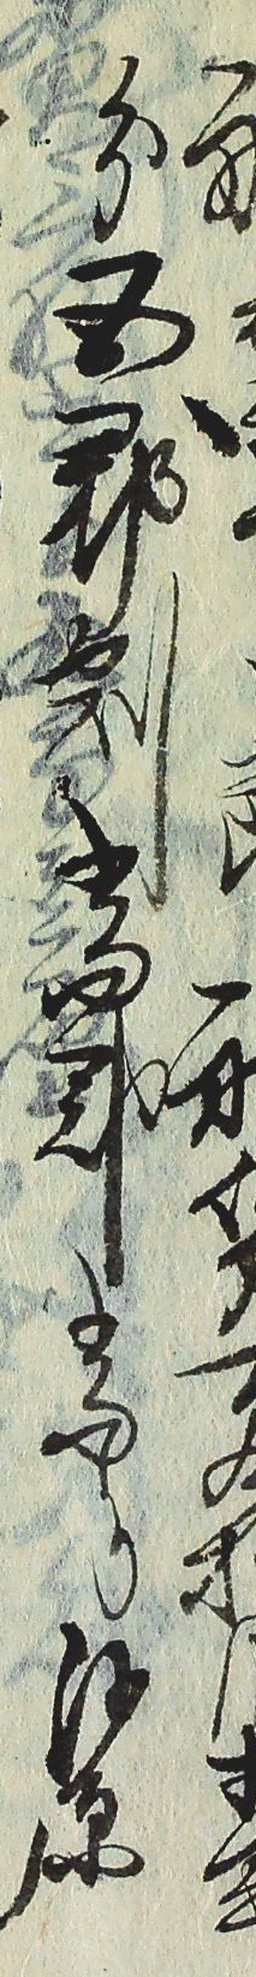分五郡割当郡当り伊原
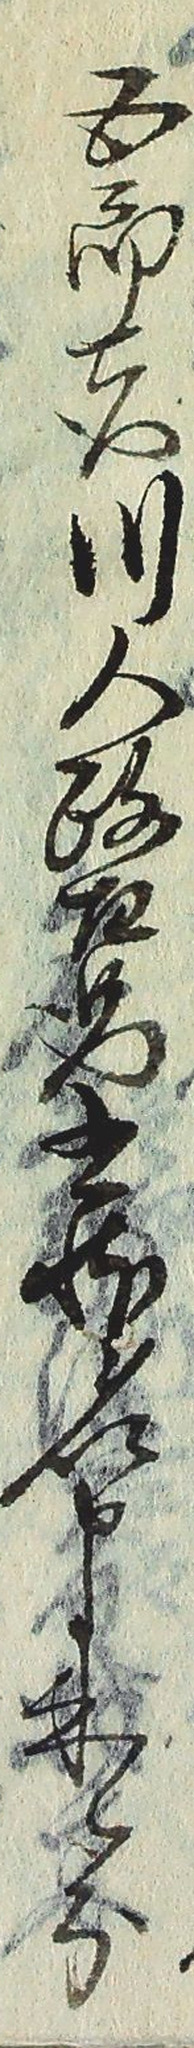五郎右衛門川人政左衛門書状を以申来候分
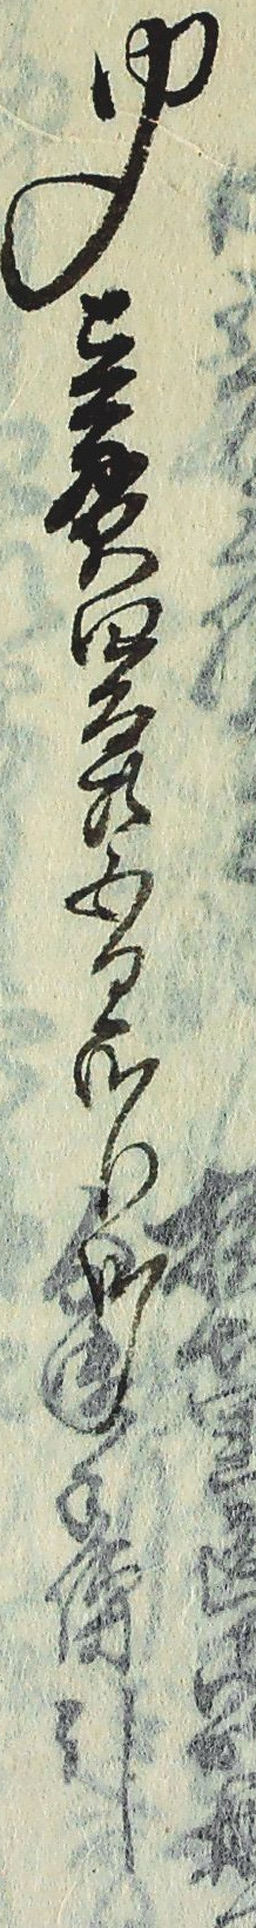内〆壱貫四百拾五匁弐分弐厘
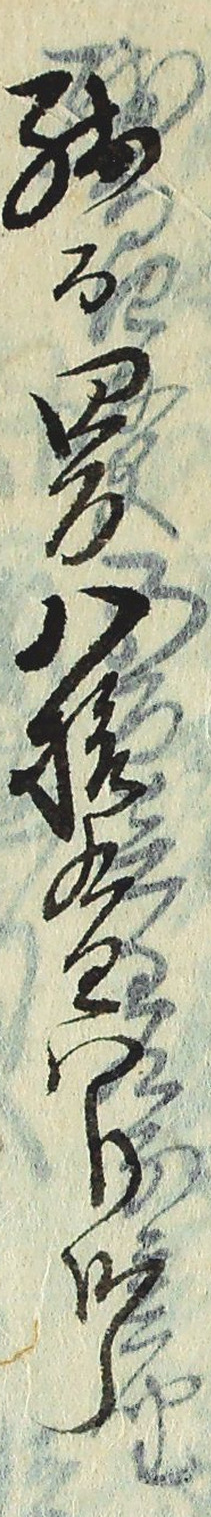残て四百八拾九匁八分弐厘
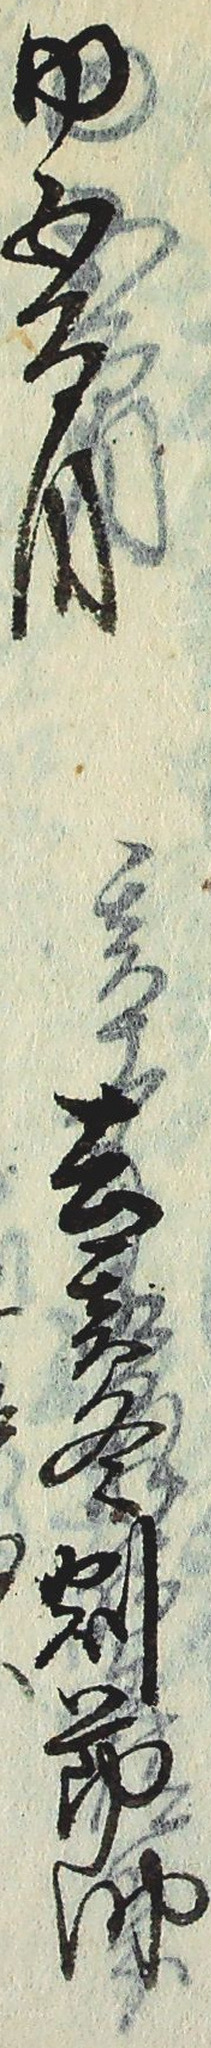内五百目去亥冬割節助
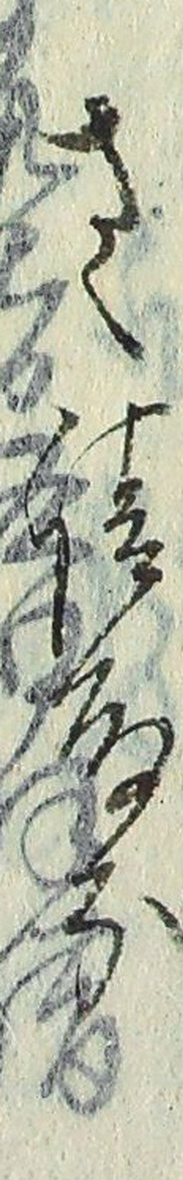方へ請取分
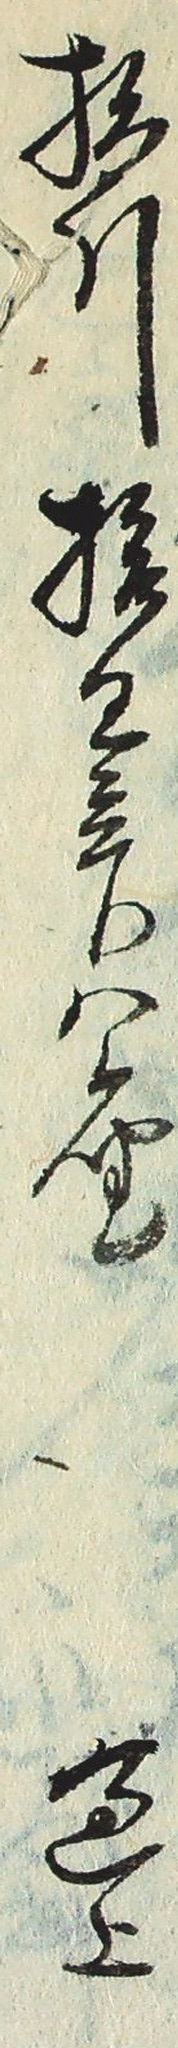指引拾匁壱分八厘過上

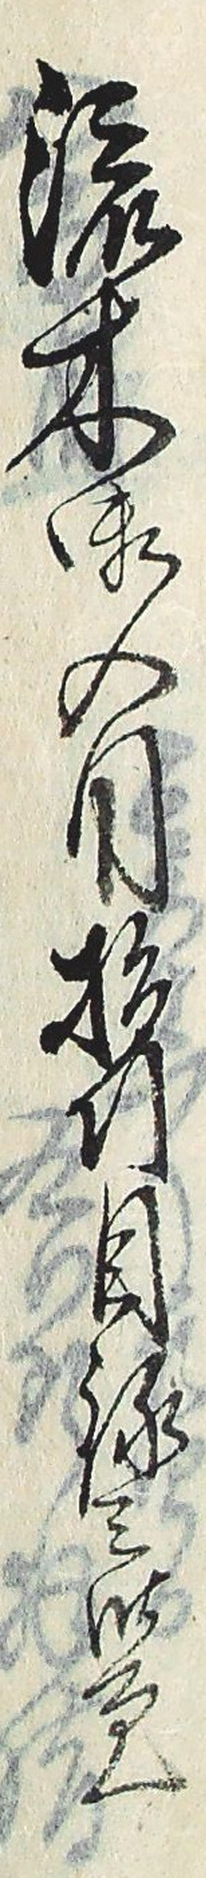流木御入用指引目録之覚
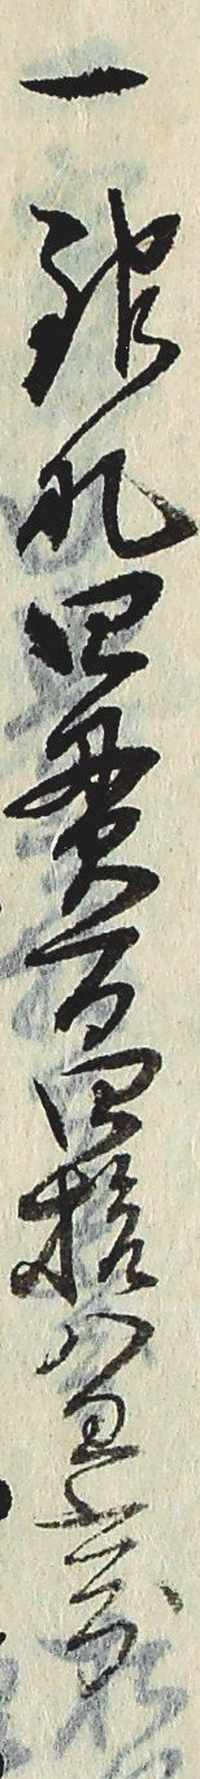一銀札四貫百四拾八匁六分
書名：名東郡中諸割賦元帳
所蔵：鳴門教育大学 Naruto University of Education
